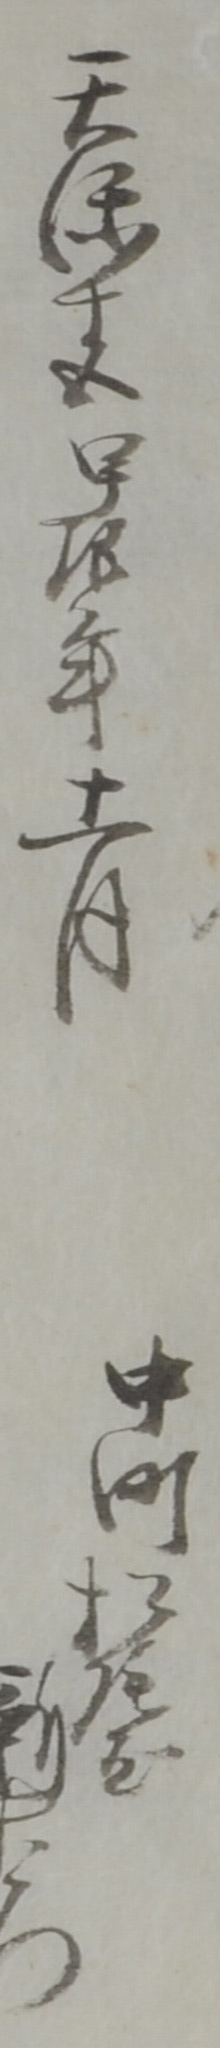天保十五甲辰年十一月中町松尾屋
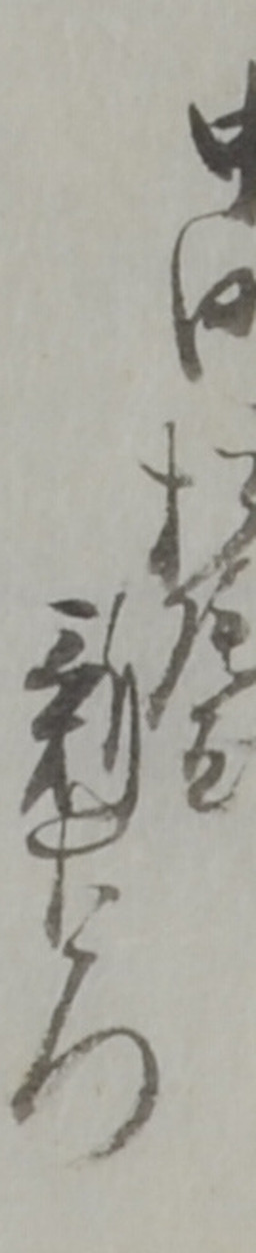新右衛門
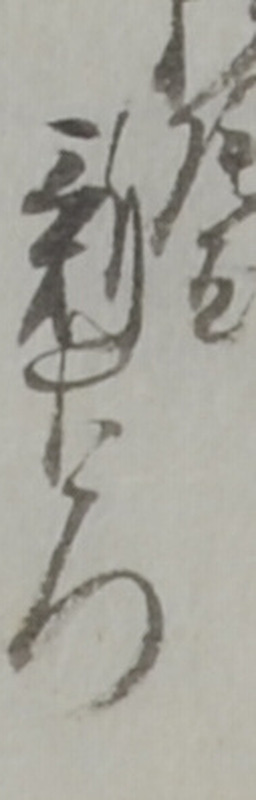新右衛門
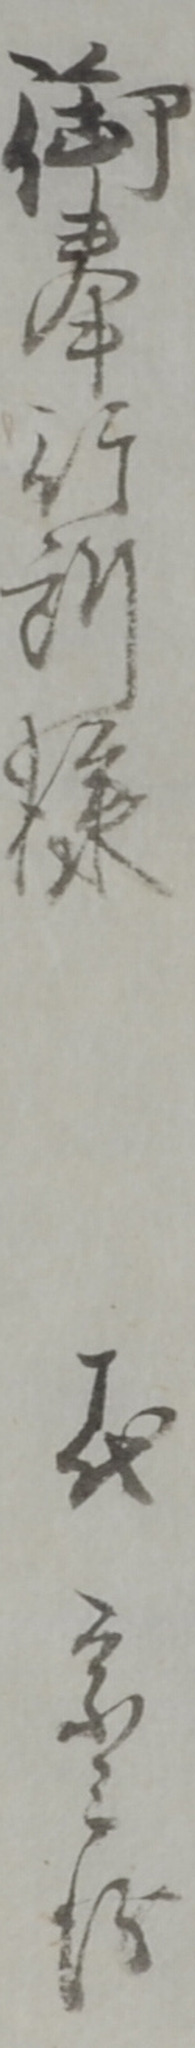御奉行所様丁代宗兵衛
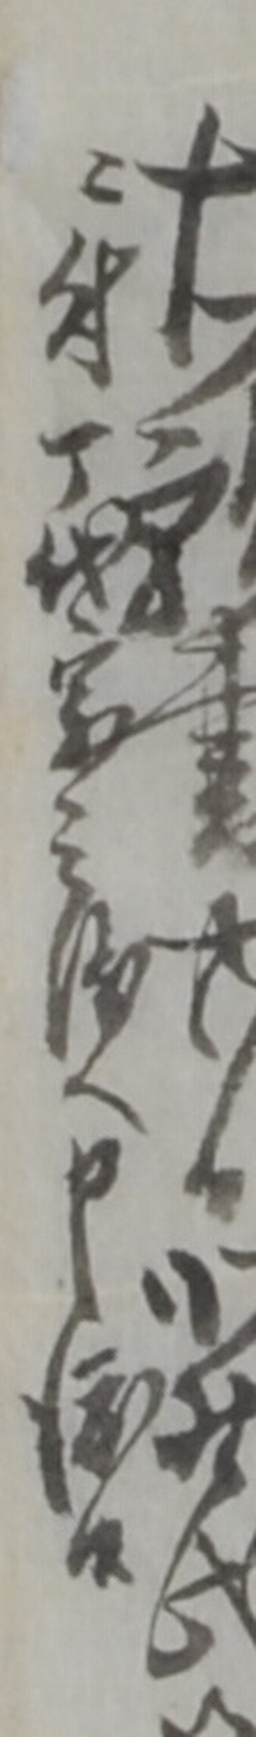ニ付丁代宗兵衛へ申渡候
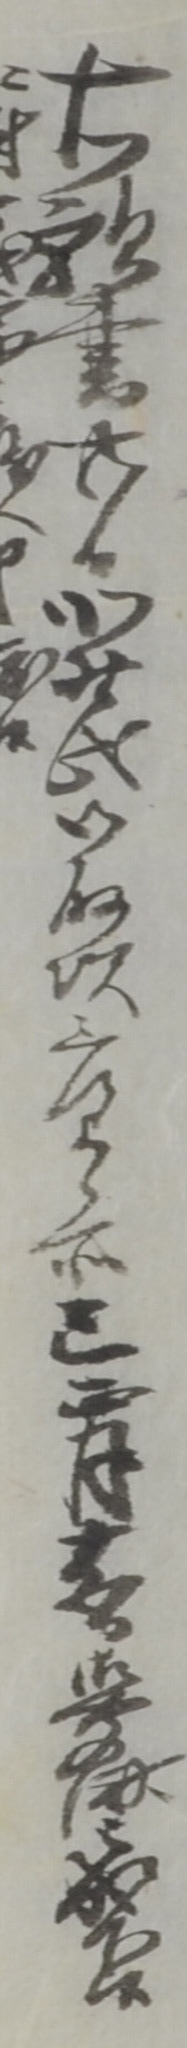右願書廿日北野氏御取次差上候所巳正月十五日御聞済被成下候

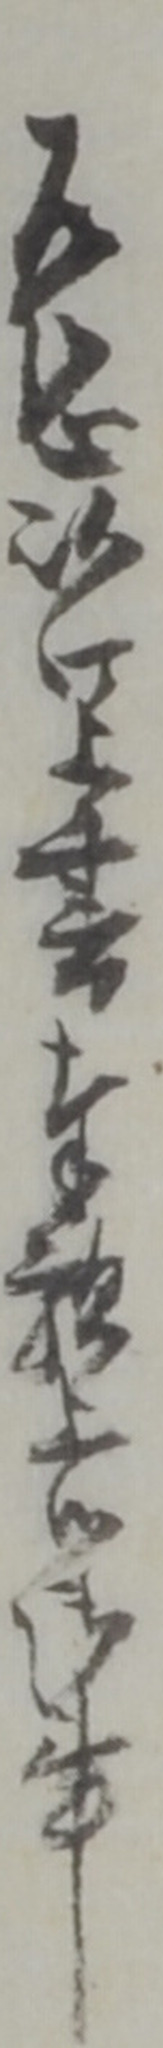乍恐以口上書奉願上候御事
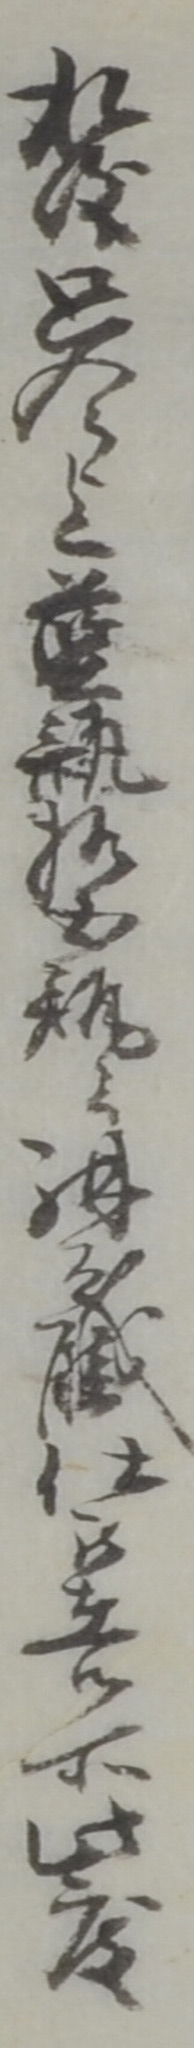私儀只今迄藍瓶拾五瓶ニ而紺屋職仕罷在候所此度
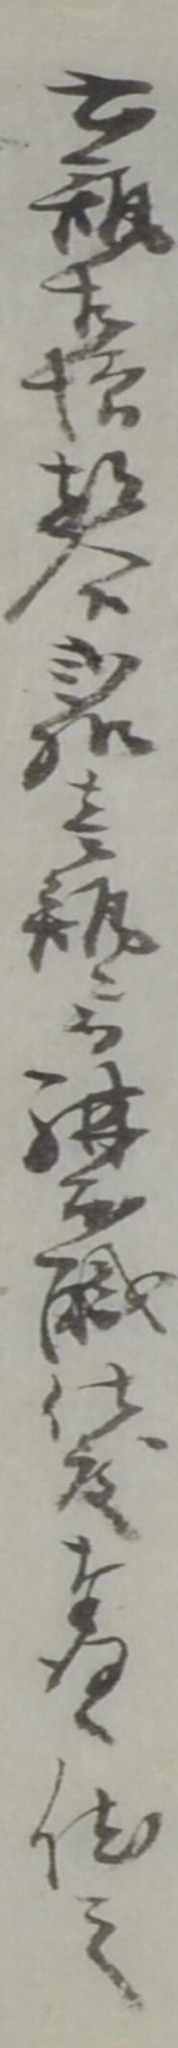六瓶相増都合弐拾壱瓶ニ而紺屋職仕度奉存候依之
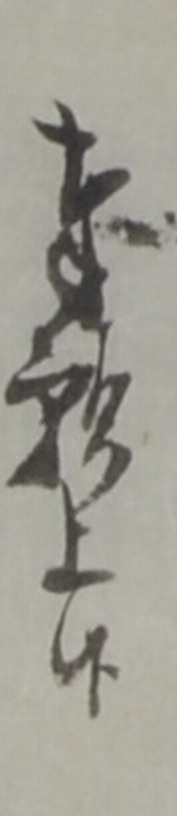奉願上候
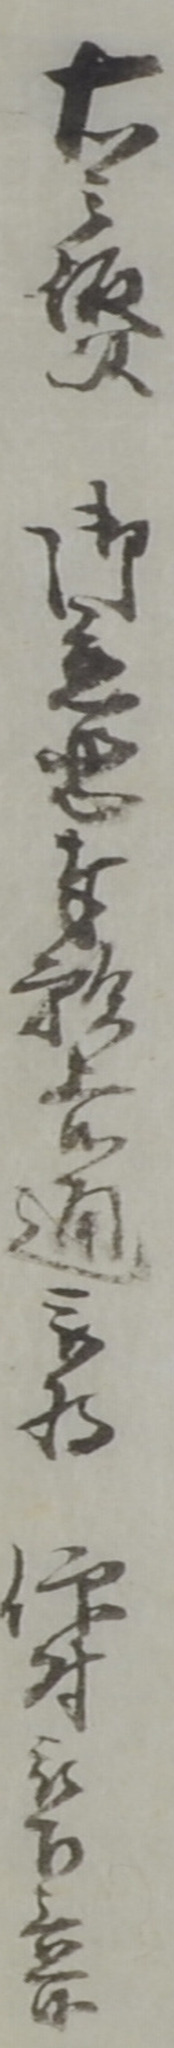右之趣以御慈悲奉願上候通被為仰付被下置候
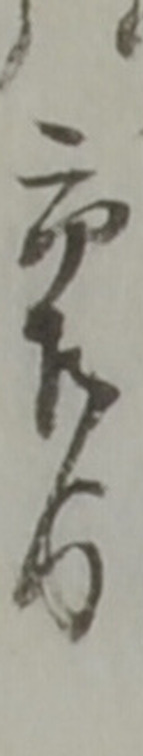市左衛門
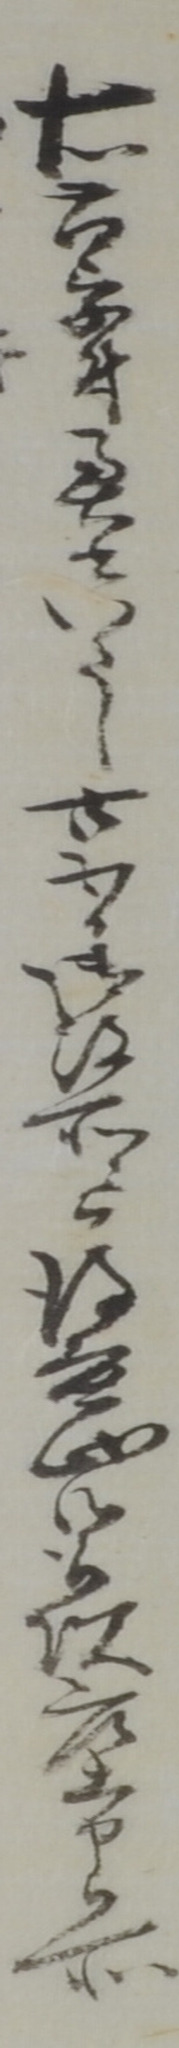右書字付奥書いたし廿五日御役所ニ而得右衛門殿御取次差上申候所
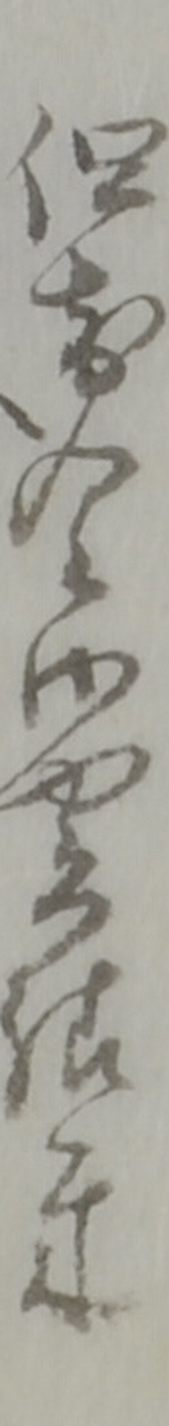但前金御買請米
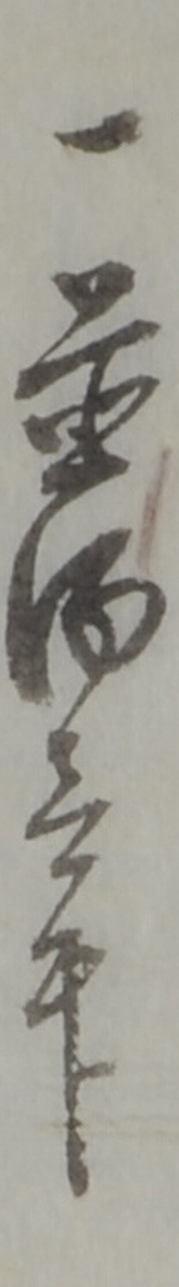一片白壱升
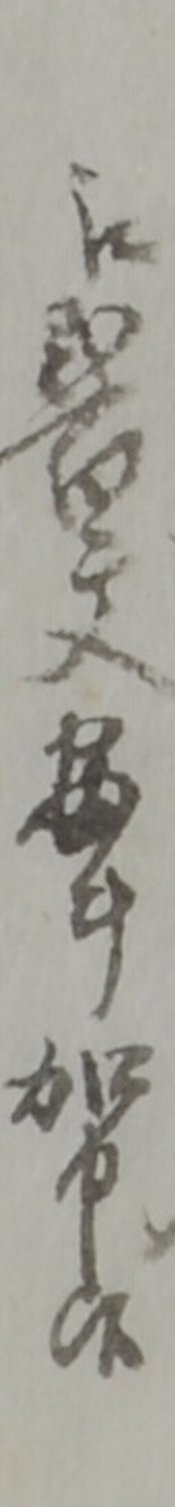江弐百文安ヲ加申候
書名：諸願書控簿
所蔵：伊那市立高遠町図書館・合同会社AMANE
